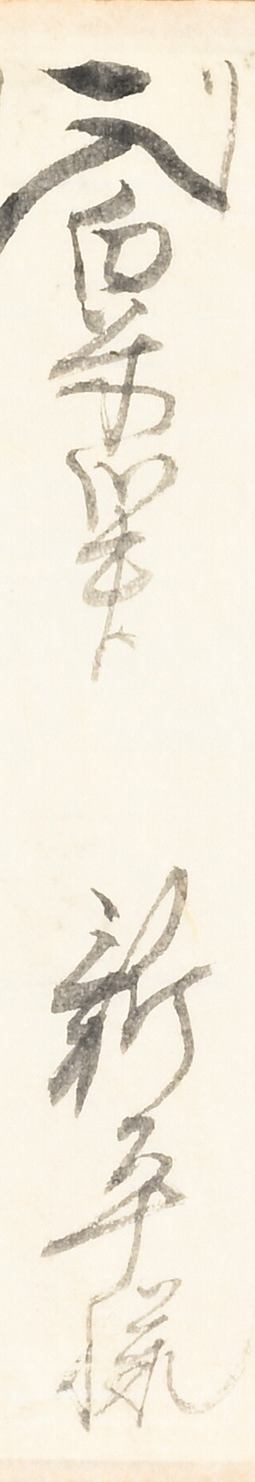一入白米弐升新平様

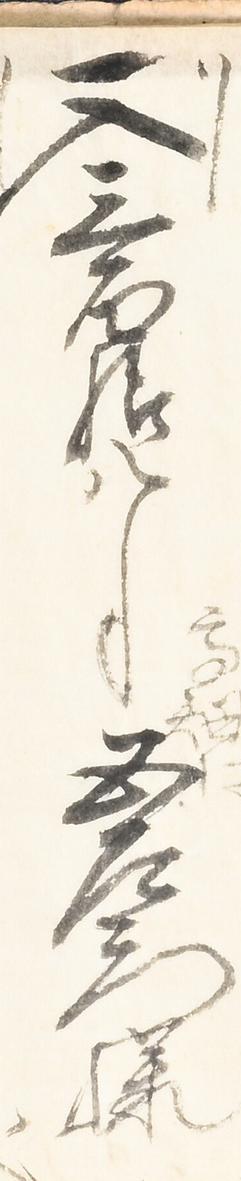一入三百拾八文五左衛門様
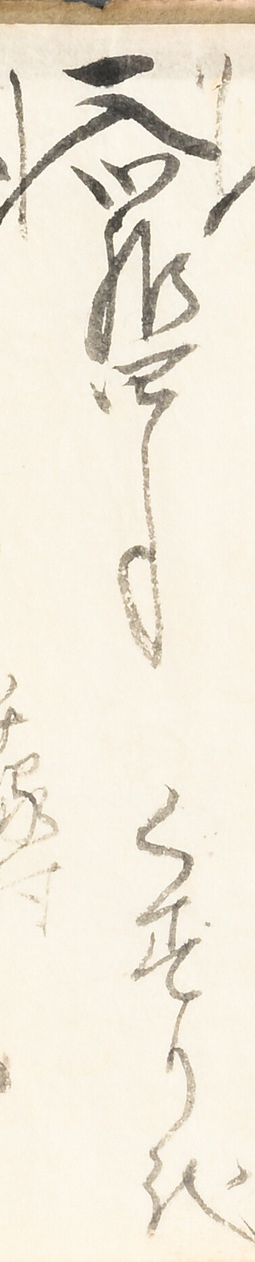一入弐拾四文くすり代
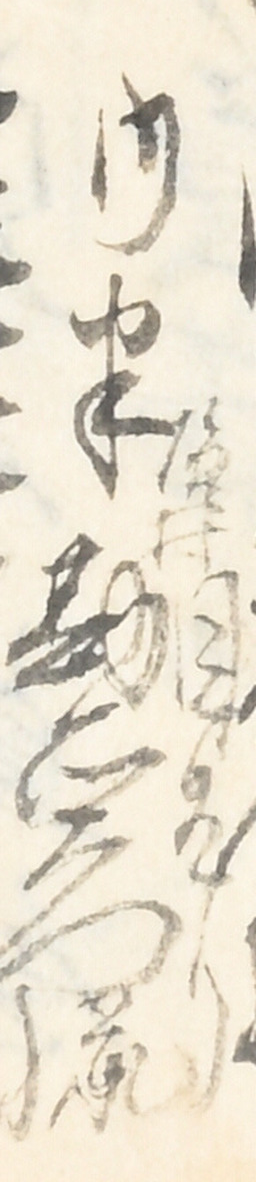内半人惣右衛門様

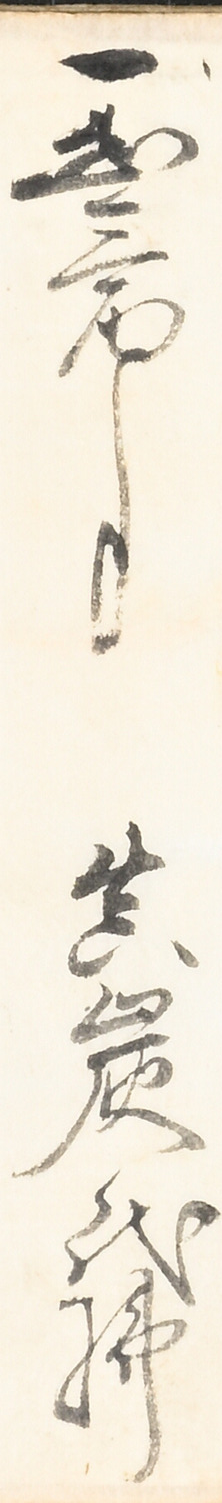一出三百真炭代拂

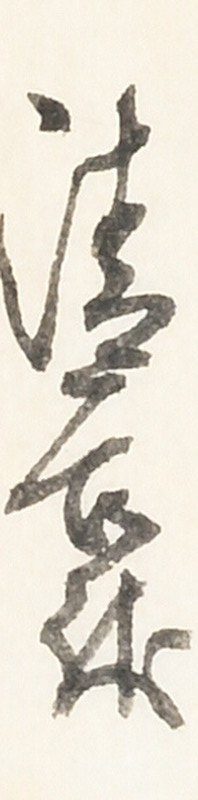清吉休
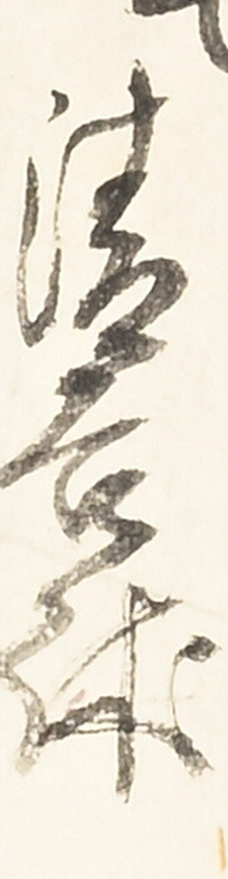清吉休
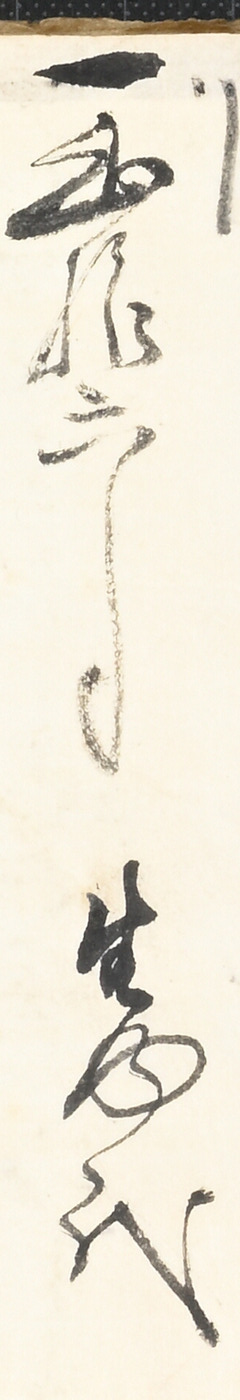一出拾六生ゆ代

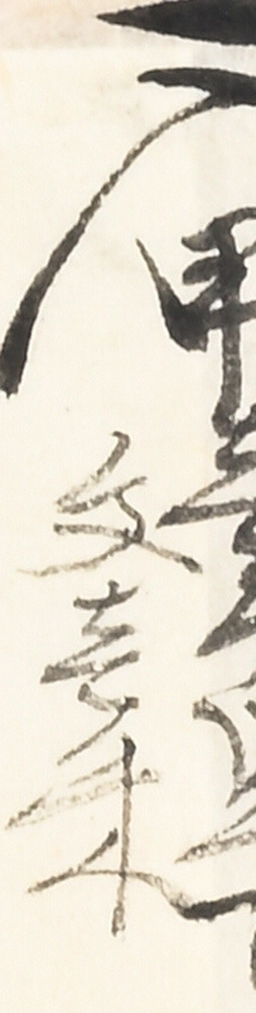文壱朱
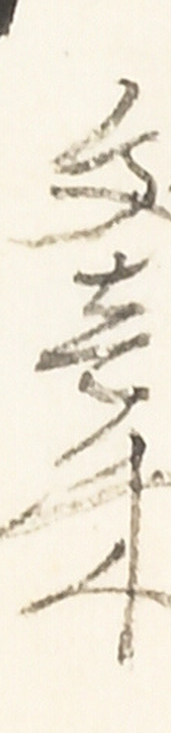文壱朱
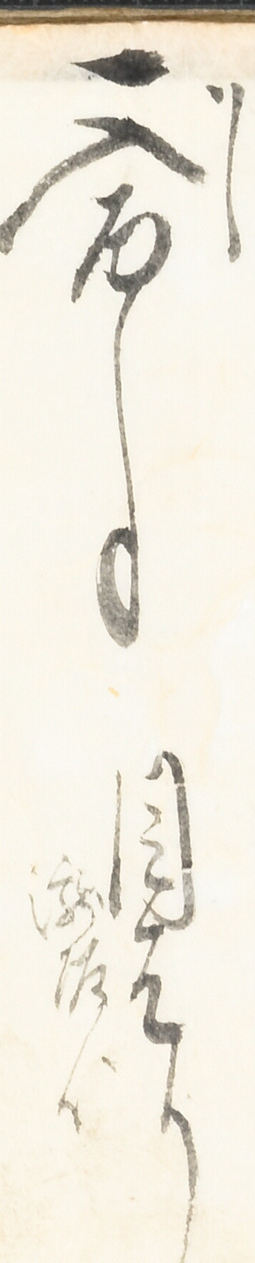一入百文目はり
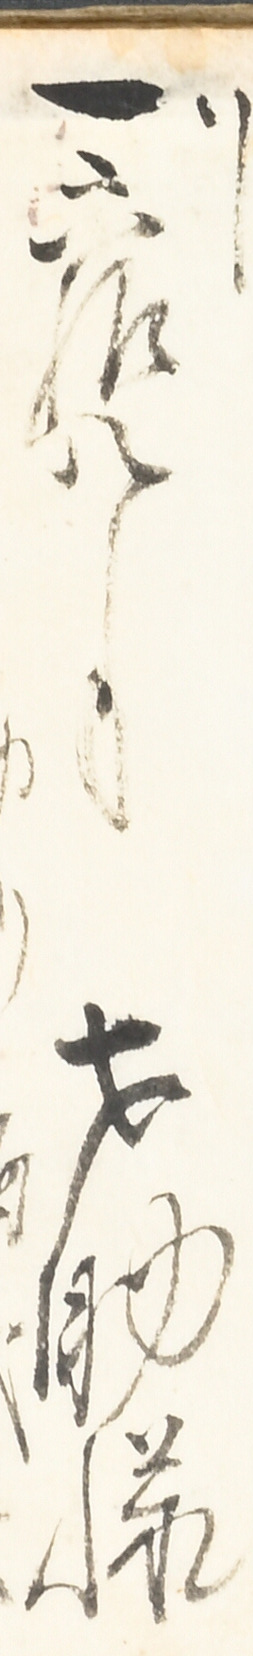一六拾八文才助様

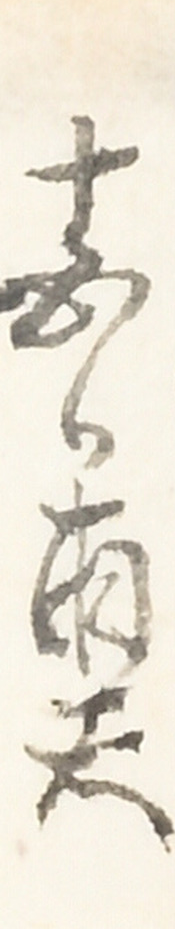十四日雨天
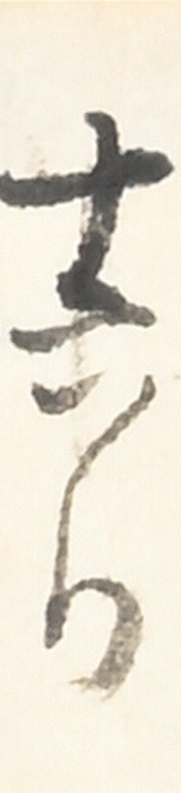十六日
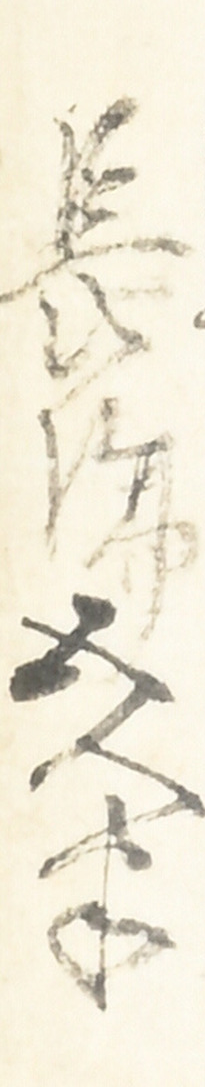長橋五人半
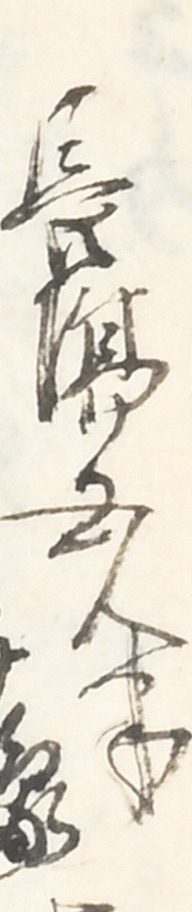長橋五人半
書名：天保十巳癸（亥）年正月大吉祥日萬日記控帳
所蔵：伊那市立高遠町図書館・合同会社AMANE
